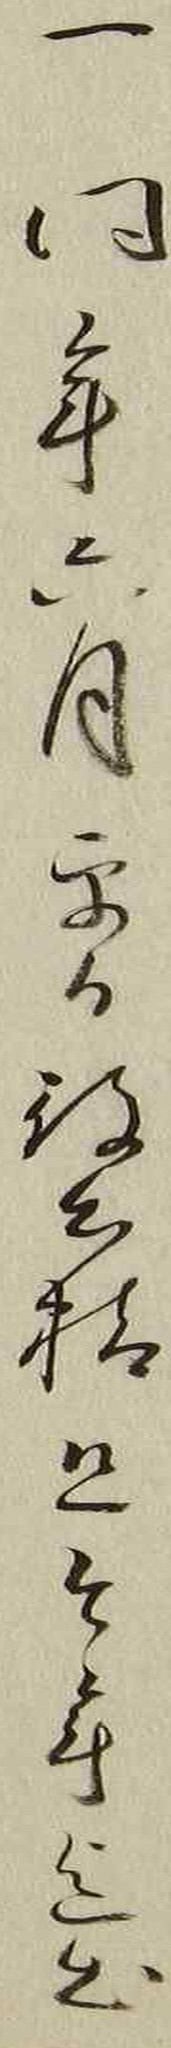一同年六月平日役出精且今年迄出
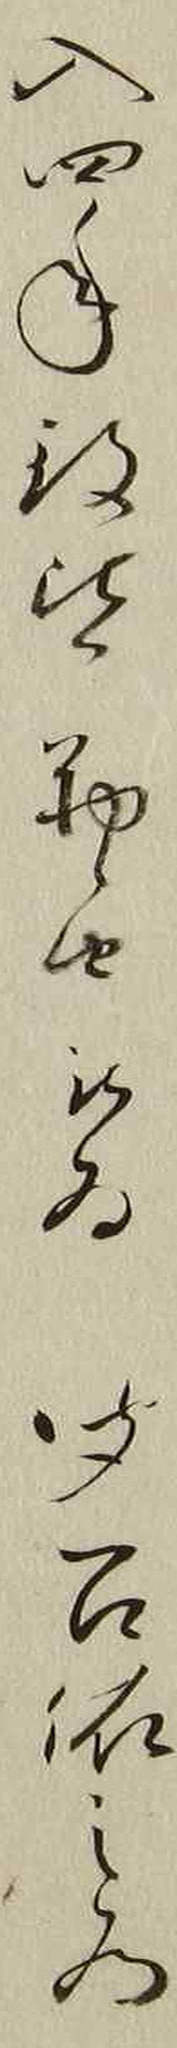入四年致皆勤候由被為聞召依之為
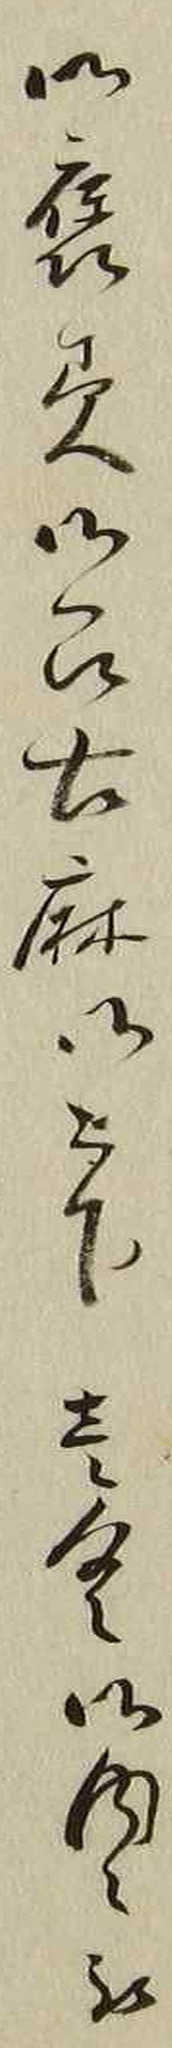御褒美御召古麻御上下壱具御内々被
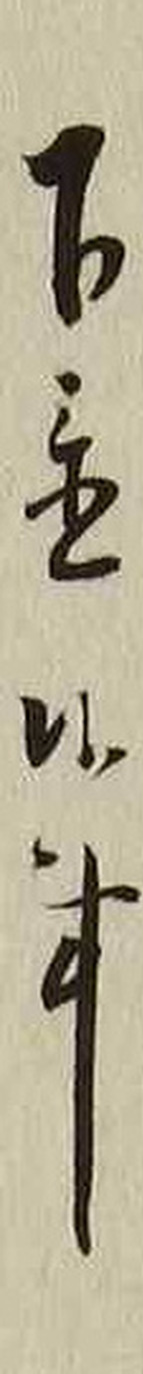下置候事
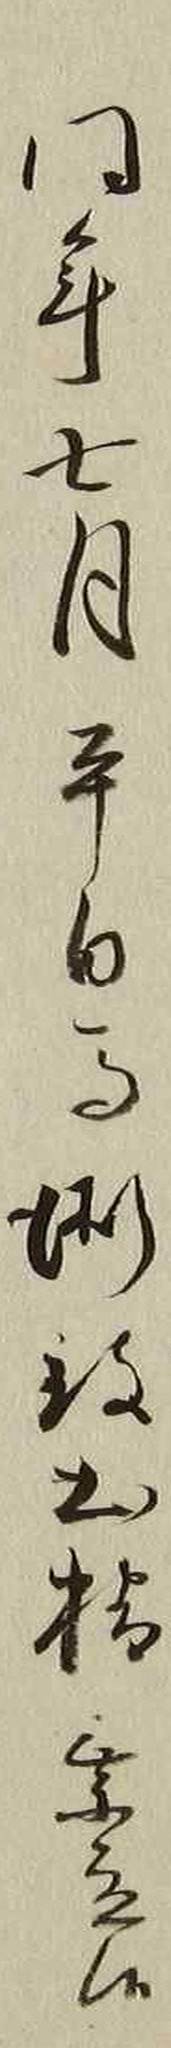一同年七月平日馬術致出精乗立候
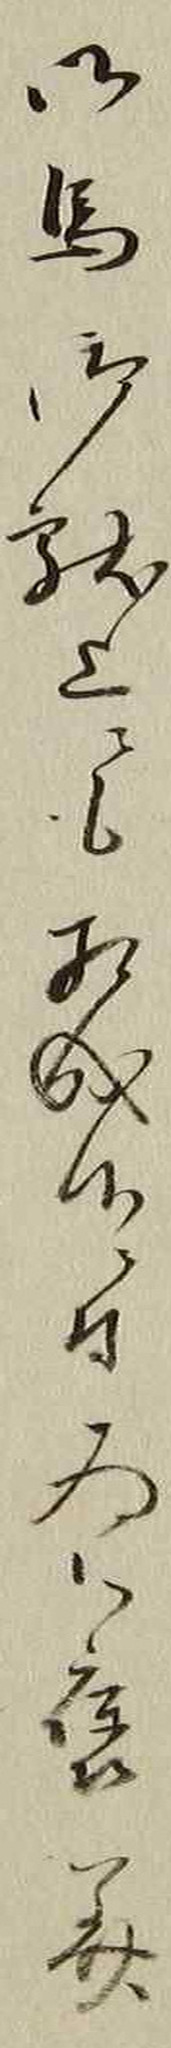御馬御献上ニも相成候ニ付為御褒美
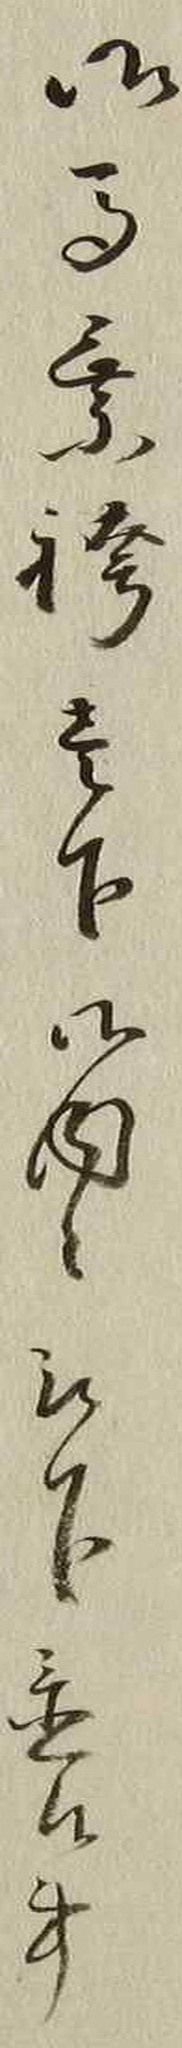御馬乗袴壱下御内々被下置候事
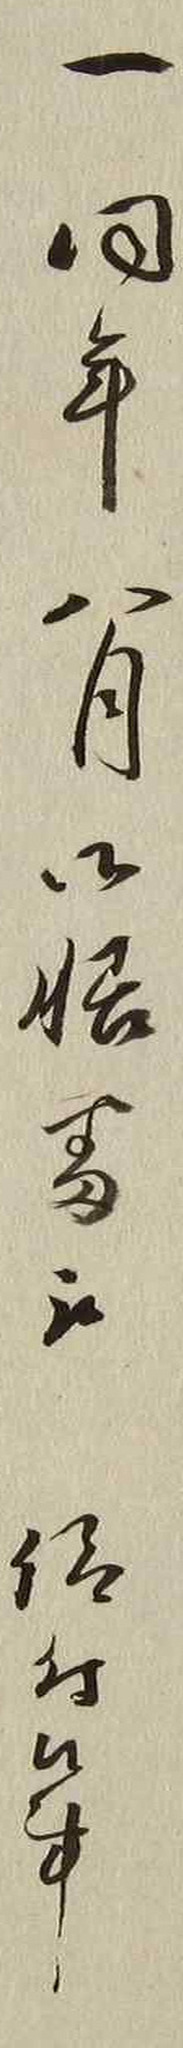一同年八月御膳番被仰付候事
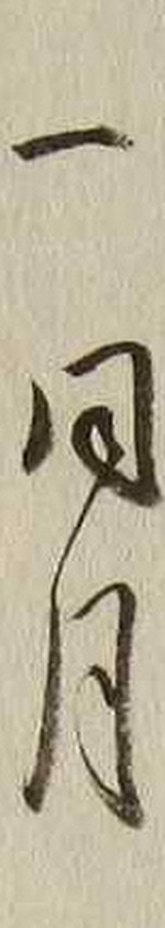一同月
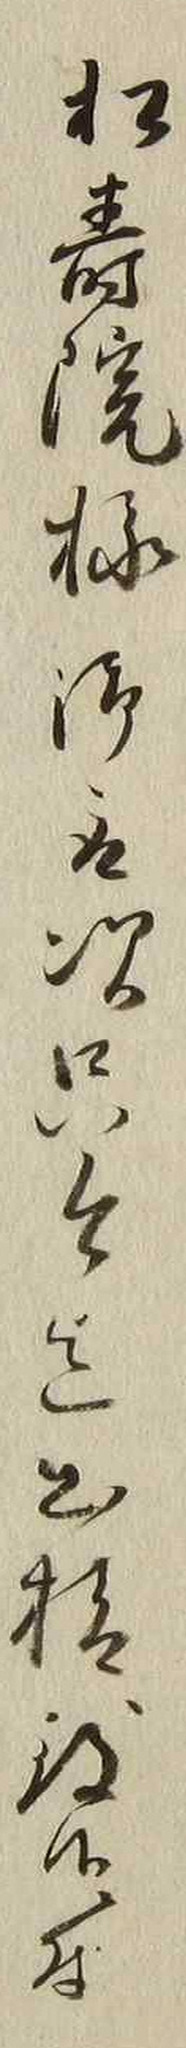松寿院様御取次只今迄出精致候ニ付
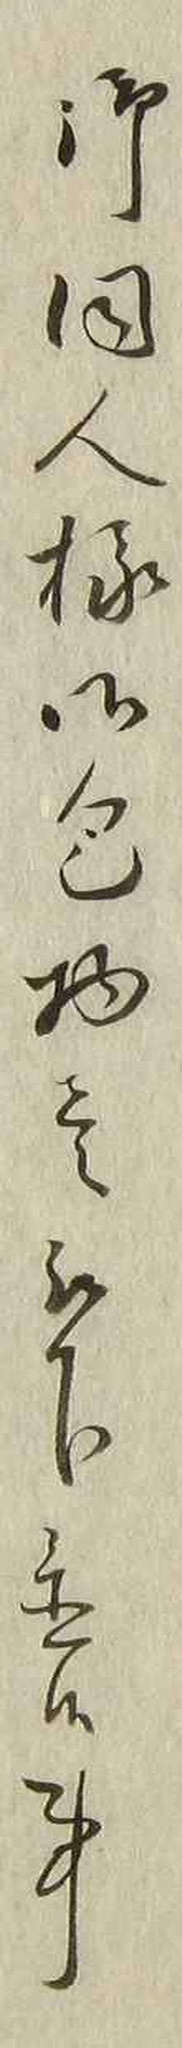御同人様御包物壱被下置候事
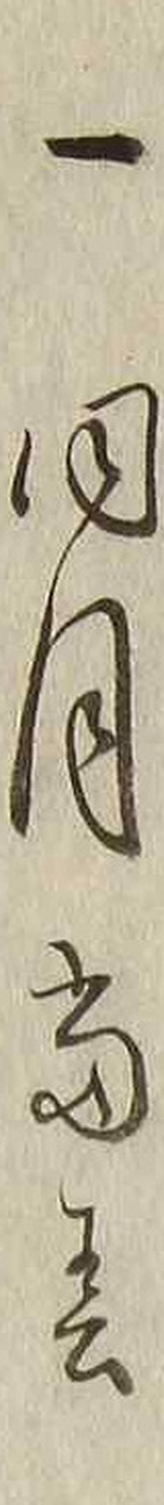一同月当春
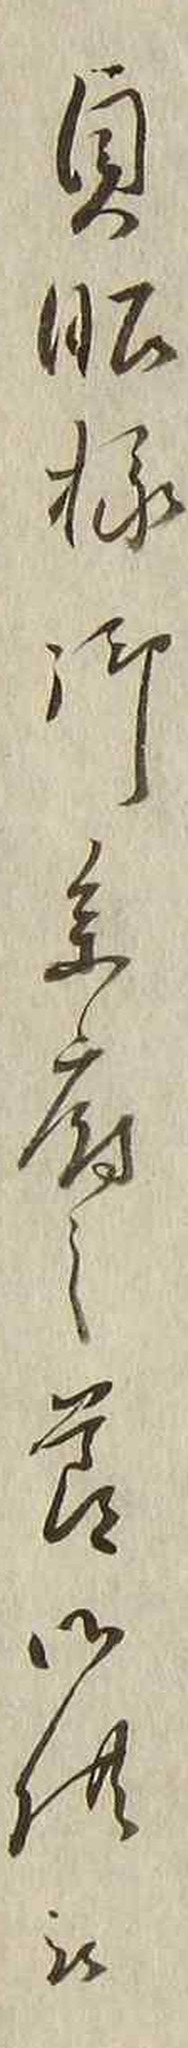貞昭様御参府々節御供被
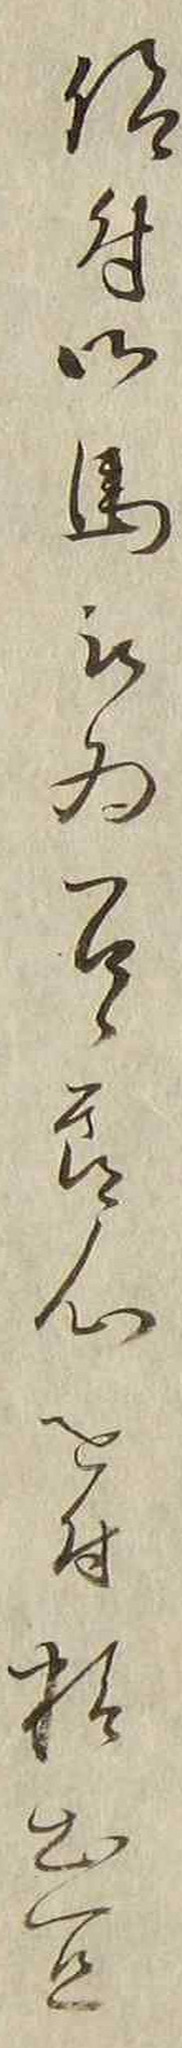仰付御馬被為召候節心を付精出宜
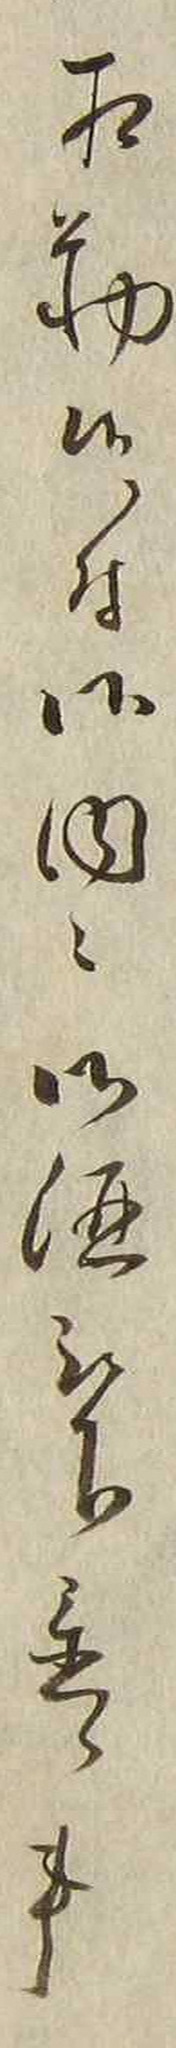相勤候ニ付御内々御酒被下置候事

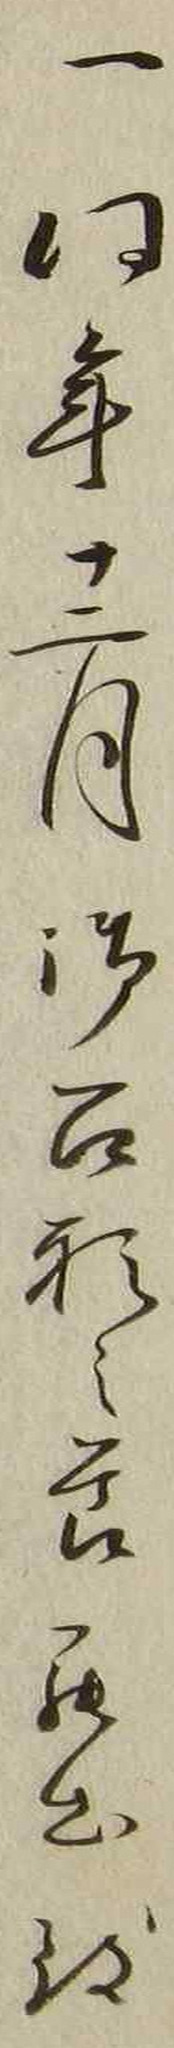一同年十二月御召形之節罷出致
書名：諸士系譜　巻之25　い之部25
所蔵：会津若松市立会津図書館
